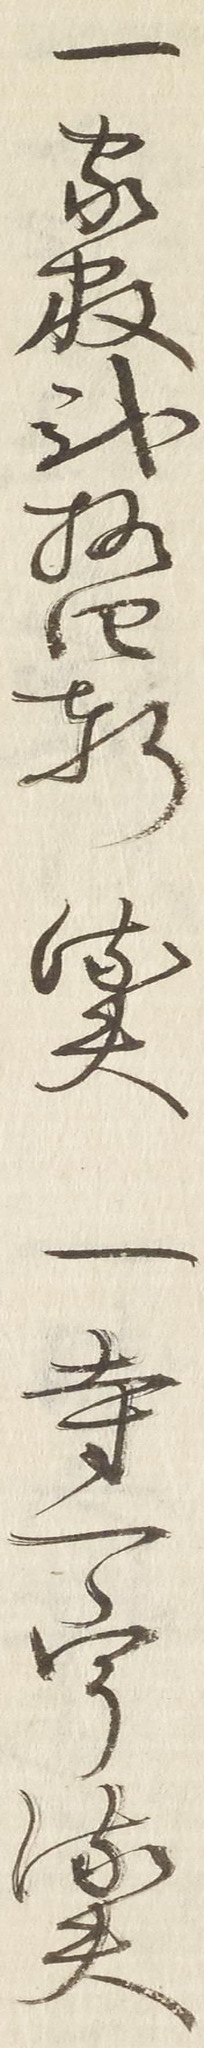一家数弐拾四軒流失一寺一宇流失
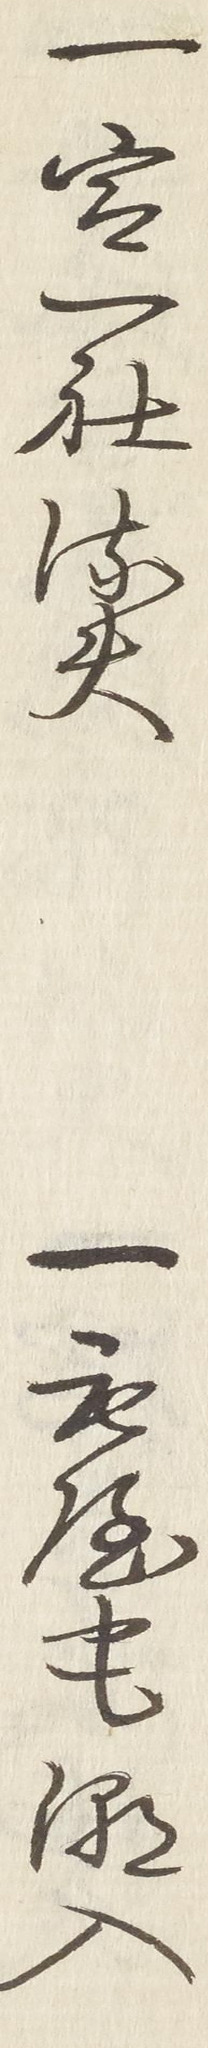一宮一社流失一庄屋宅潮入
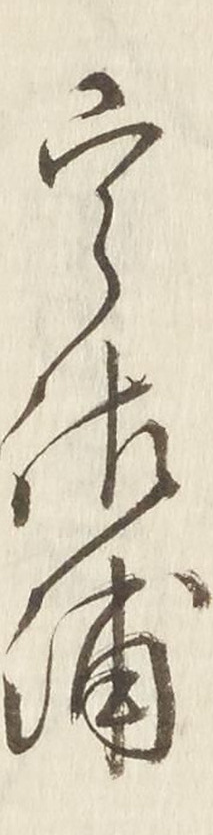宇佐浦
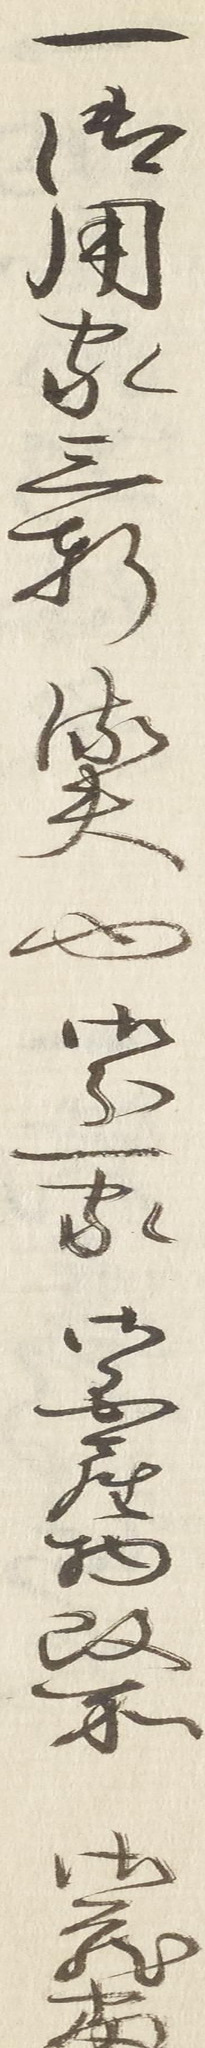一御用家三軒流失内御分一家御国産物改所御蔵番
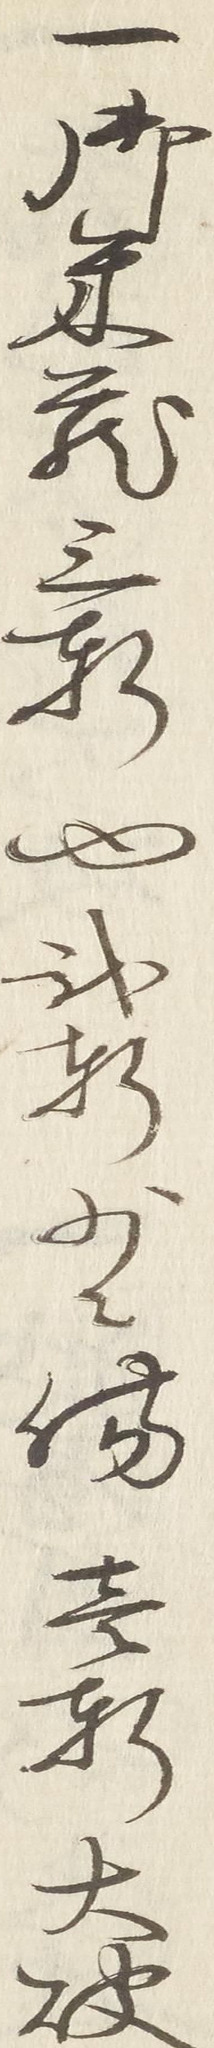一御米蔵三軒内弐軒少々傷壱軒大破
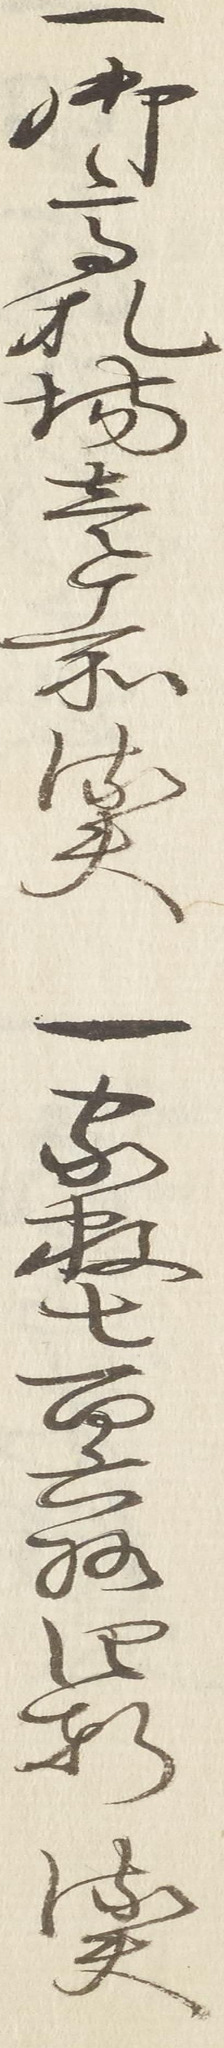一御高札場壱ヶ所流失一家数七百六拾四軒流失
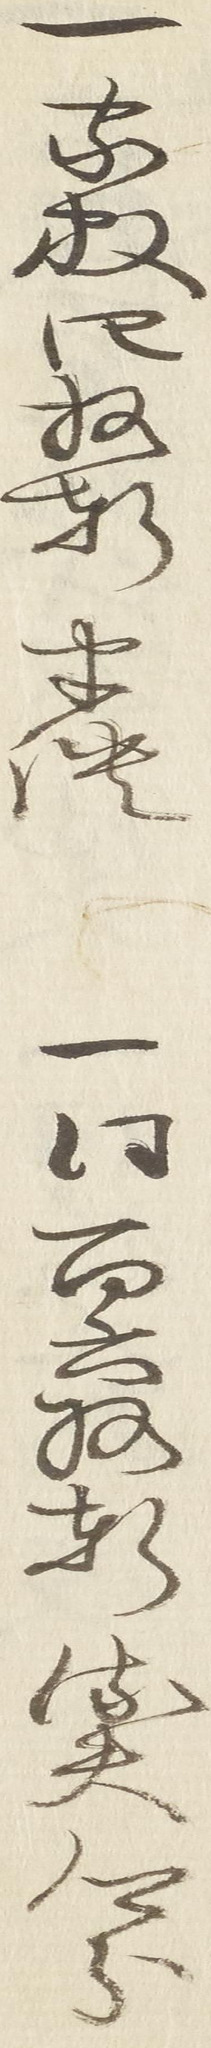一家数四拾軒半潰一同百六拾軒流失郷分
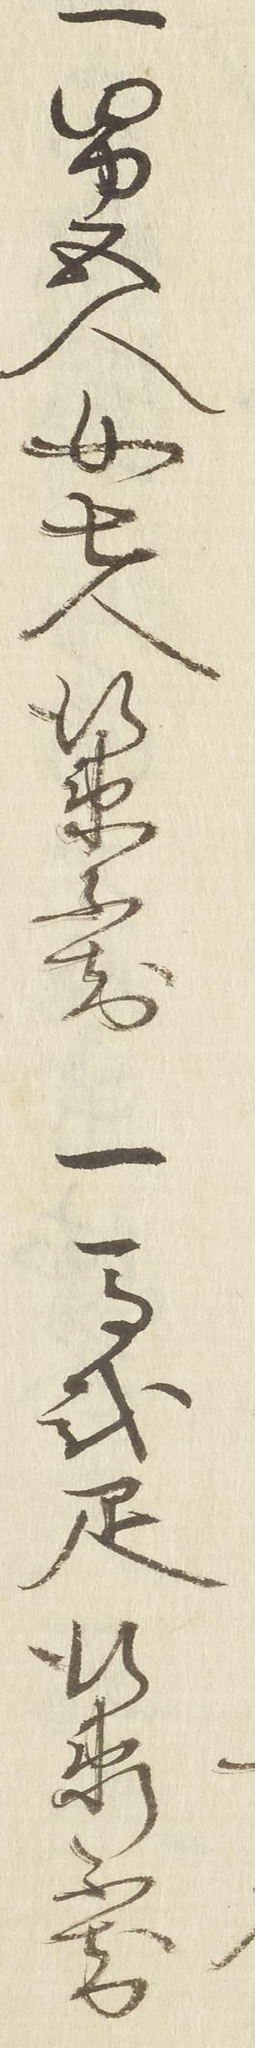一男五人女七人行衛不知一馬弐疋行衛不知

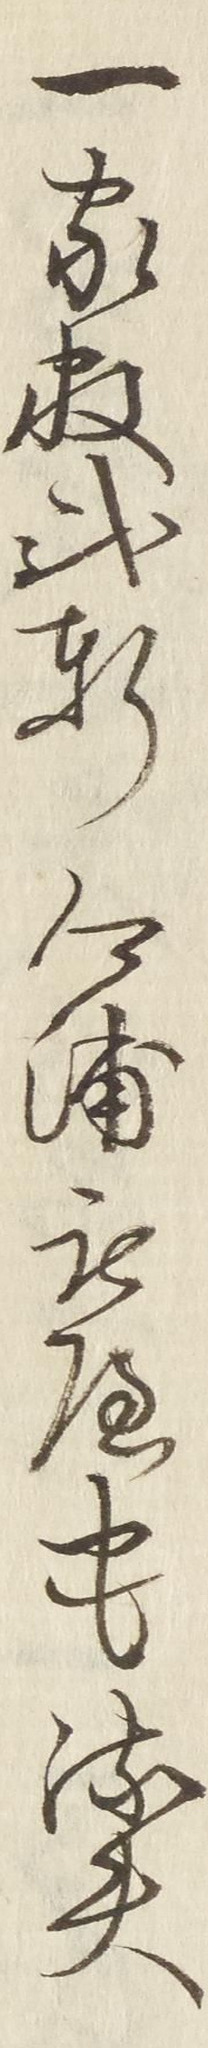一家数弐軒郷浦庄屋宅流失
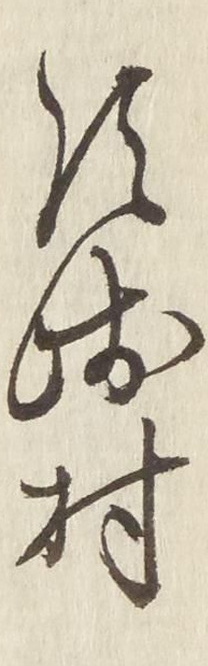須崎村
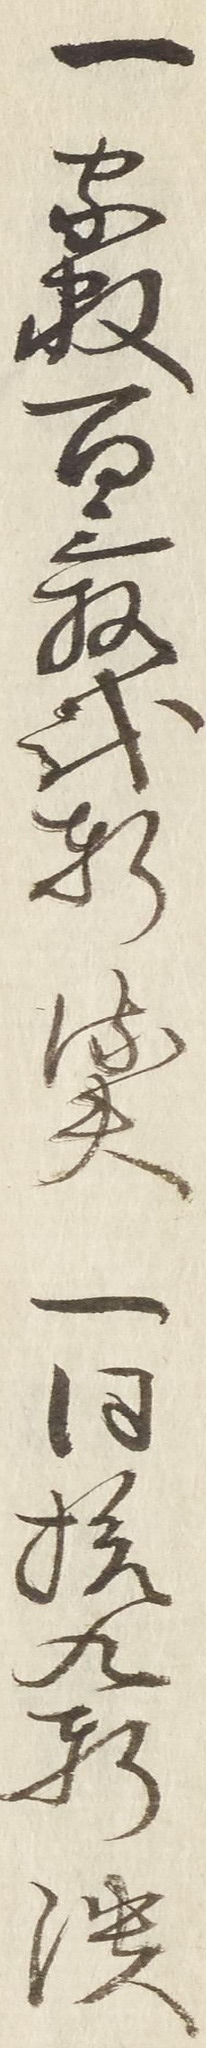一家数百三拾弐軒流失一同拾九軒潰
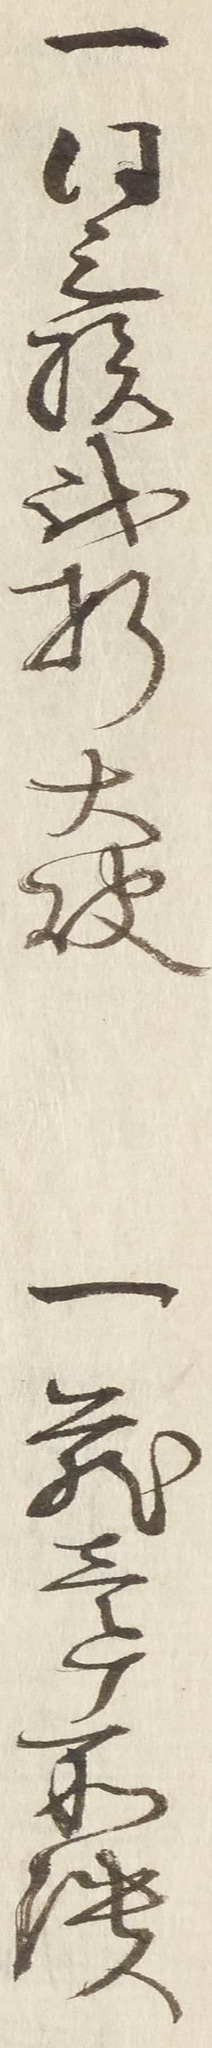一同三拾弐軒大破一蔵壱ヶ所潰
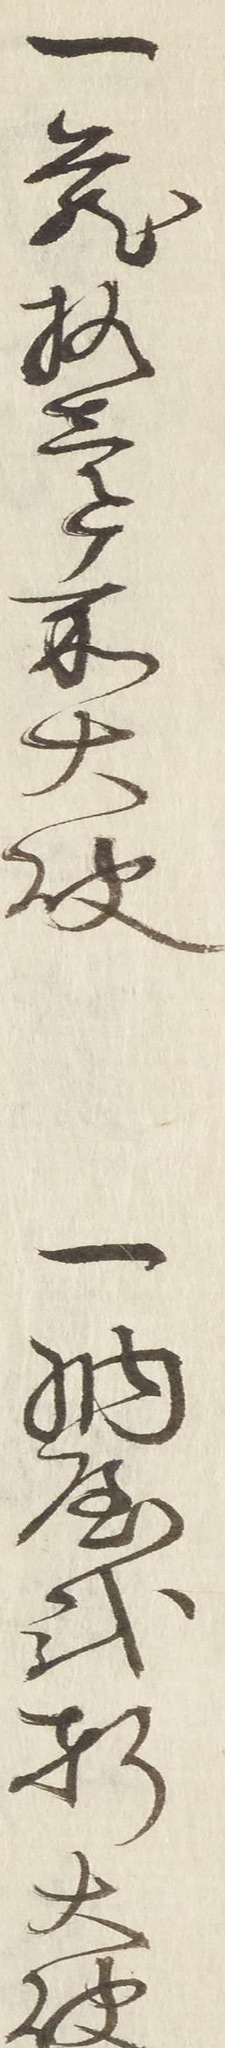一蔵拾壱ヶ所大破一納屋弐軒大破
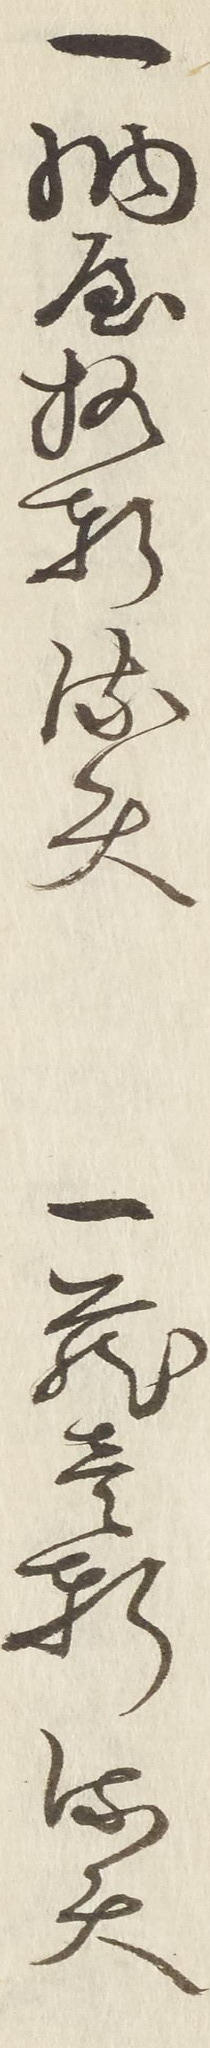一納屋拾軒流失一蔵壱軒流失
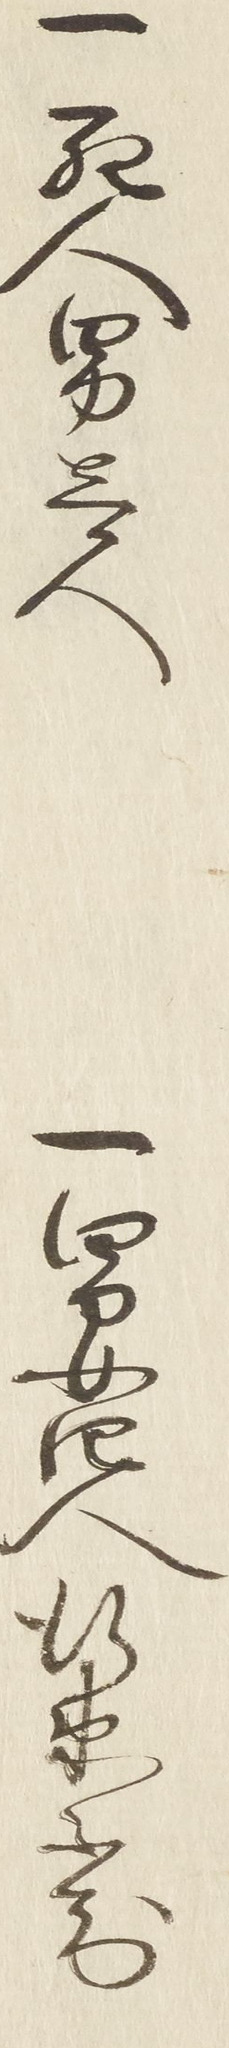一死人男壱人一男女四人行衛不知
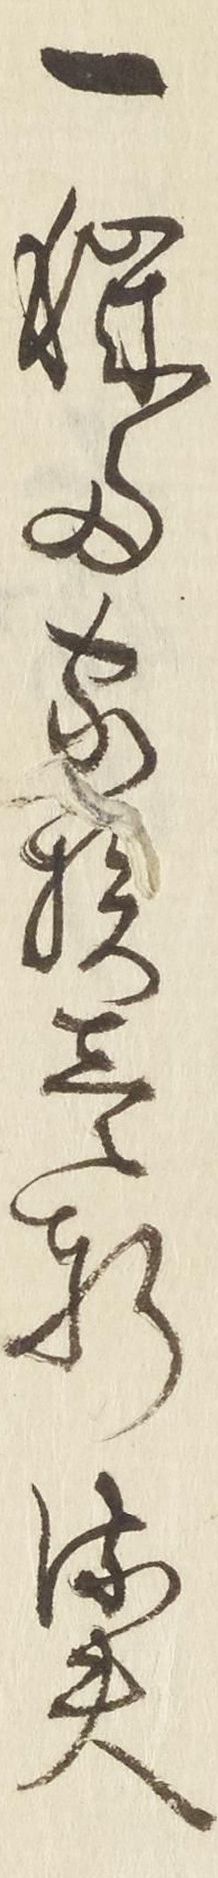一穢多家拾壱軒流失
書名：地震記　下
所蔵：東京大学地震研究所図書室 Earthquake Research Institute Library, The University of Tokyo, JAPAN
